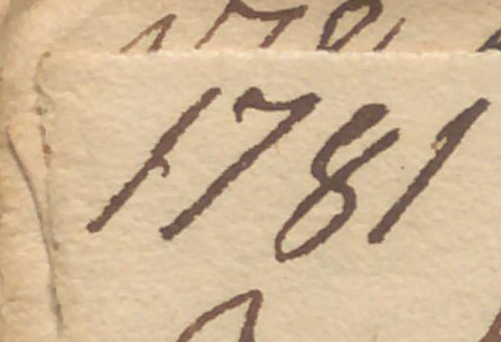1781
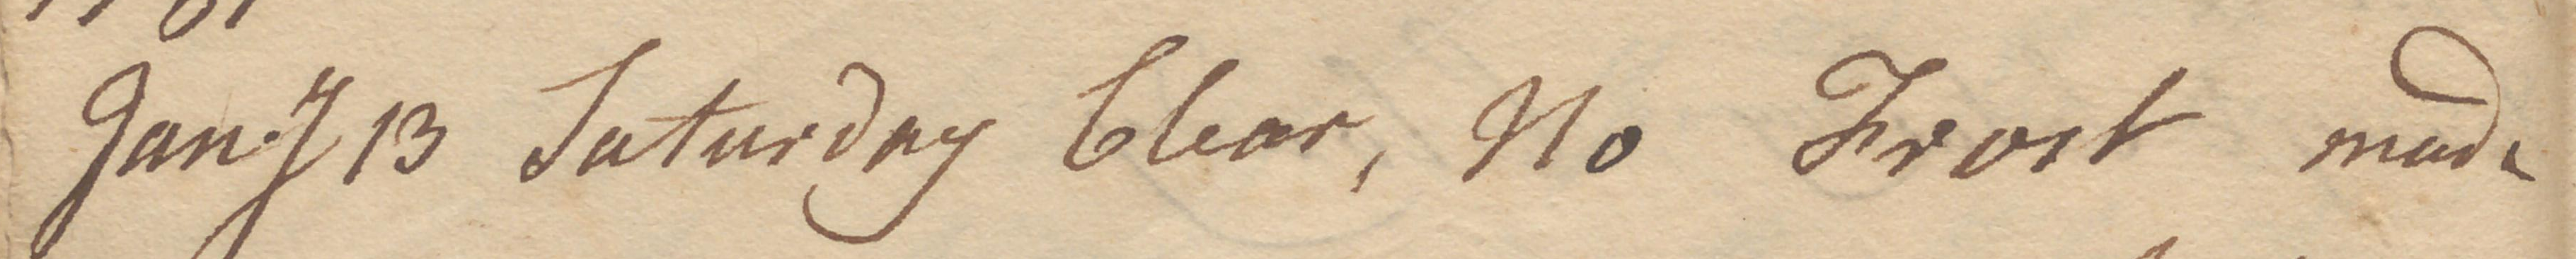Jan^y. 13 Saturday Clear, No Frost made
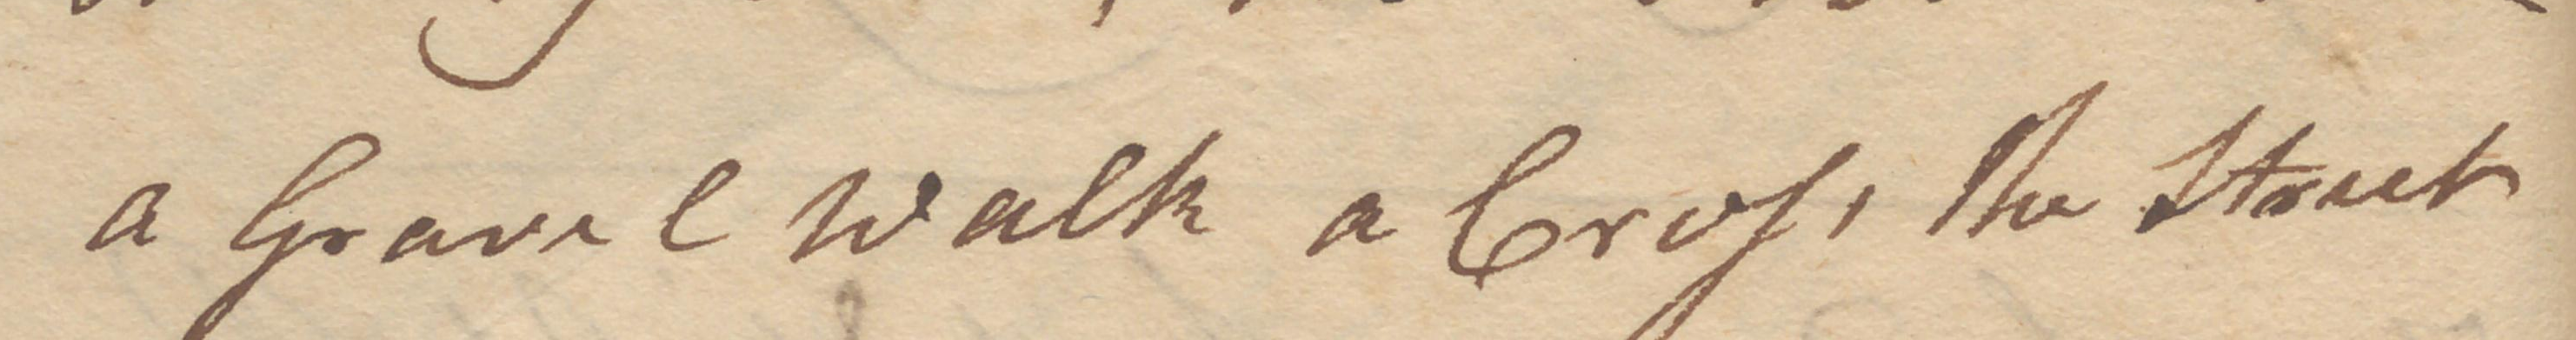a Gravel walk a Cross the Street
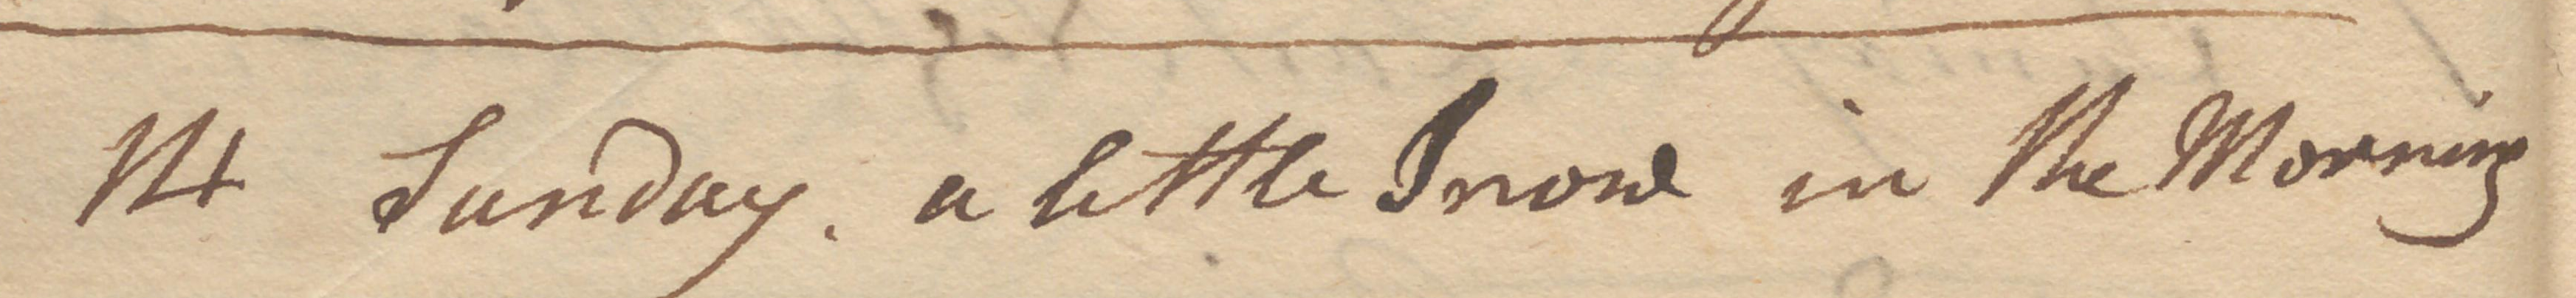14 Sunday, a little snow in the Morning
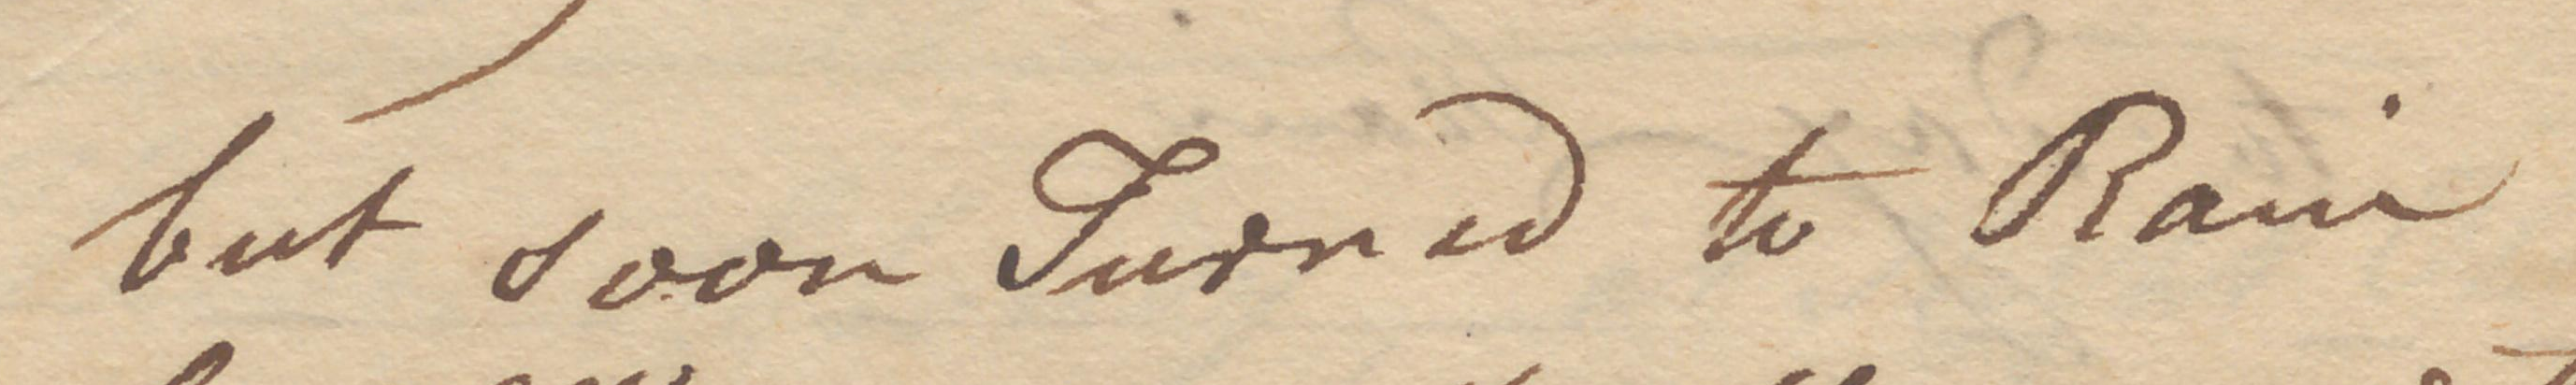but soon Turned to Rain
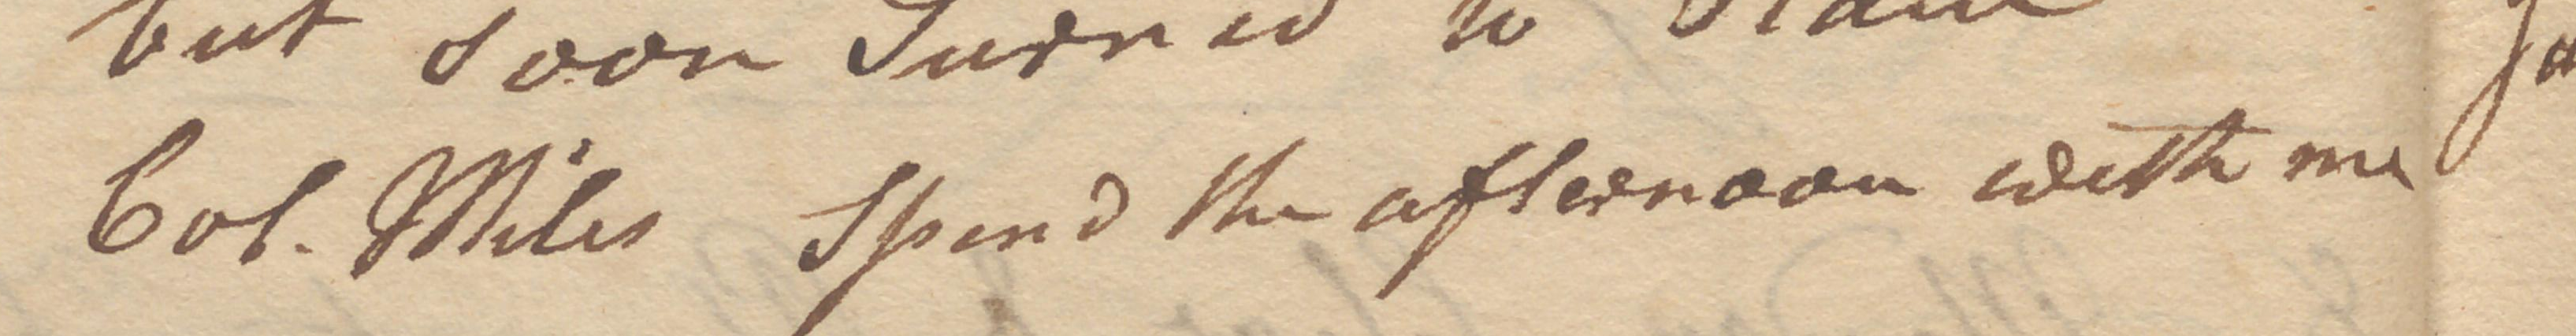Col. Miles spend the afternoon with me
